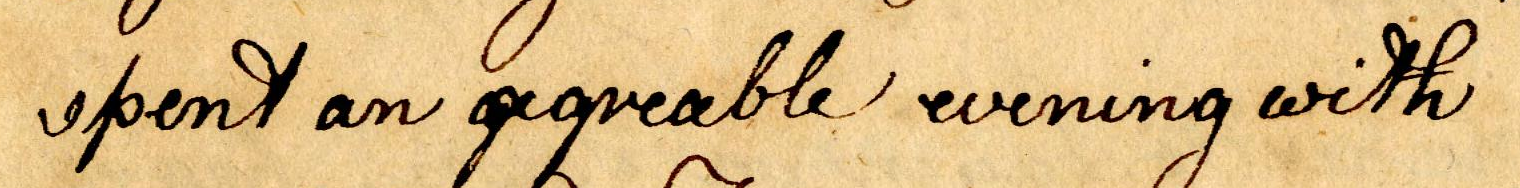spent an agreable evening with
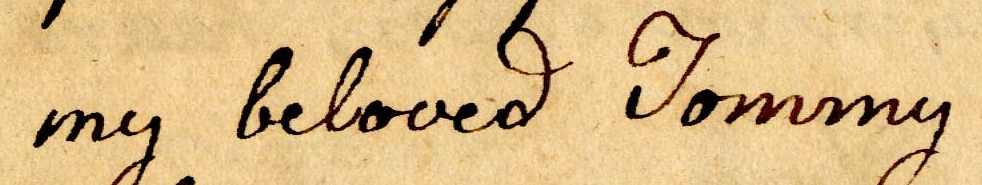my beloved Tommy
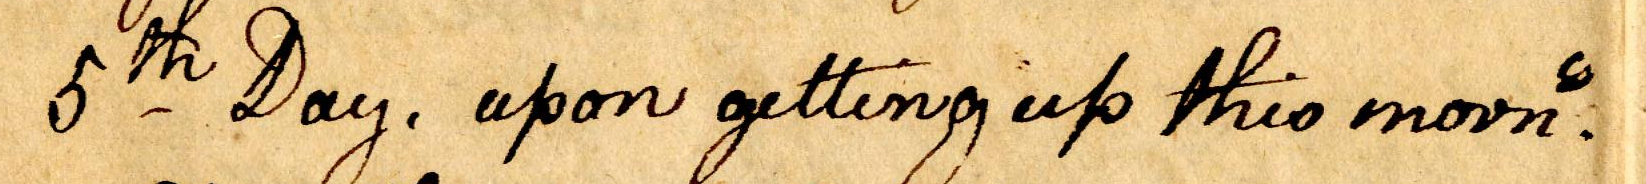5^th Day, upon getting up this morn^g.
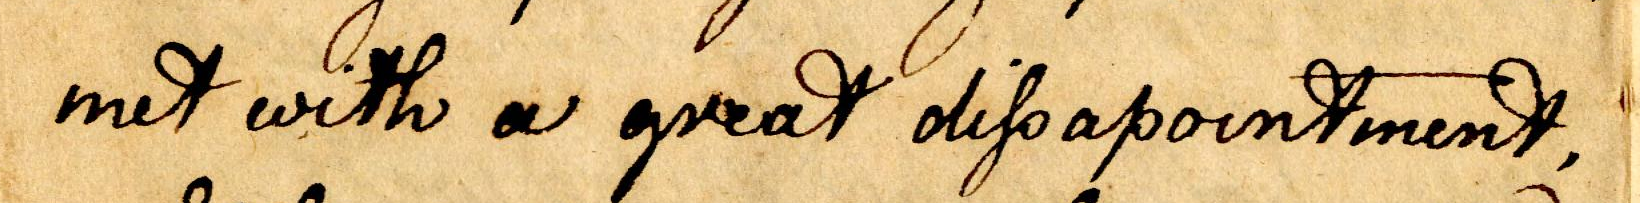met with a great dissapointment,
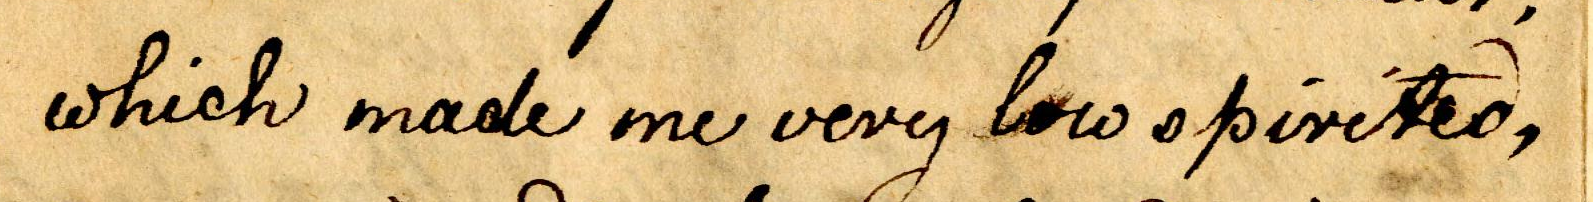which made me very low spirited,
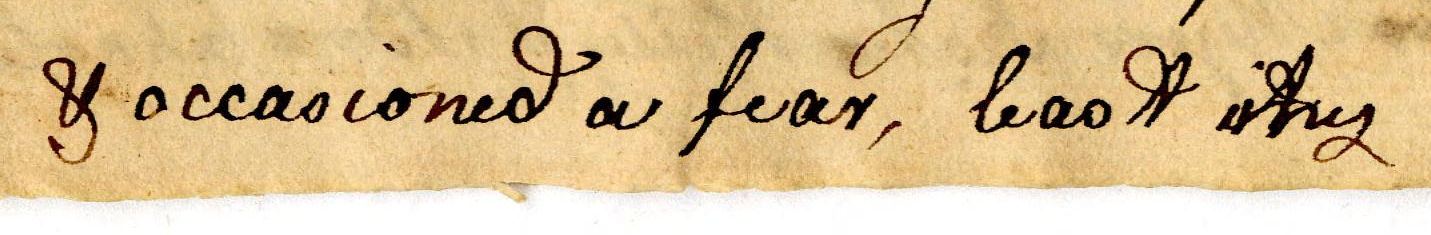& occasioned a fear, least thy
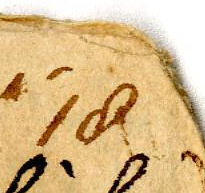18
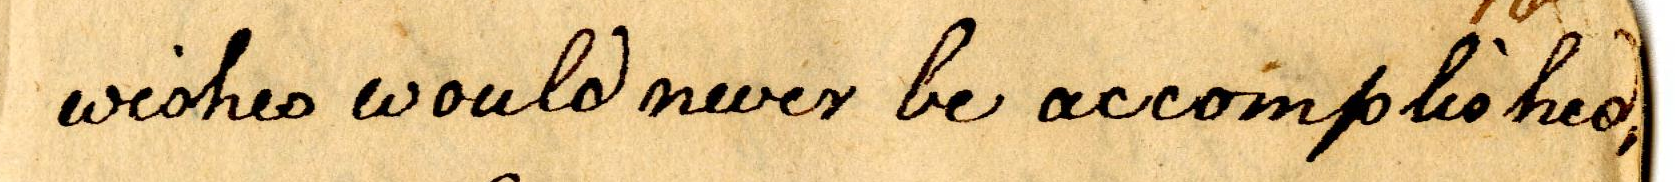wishes would never be accomplished,
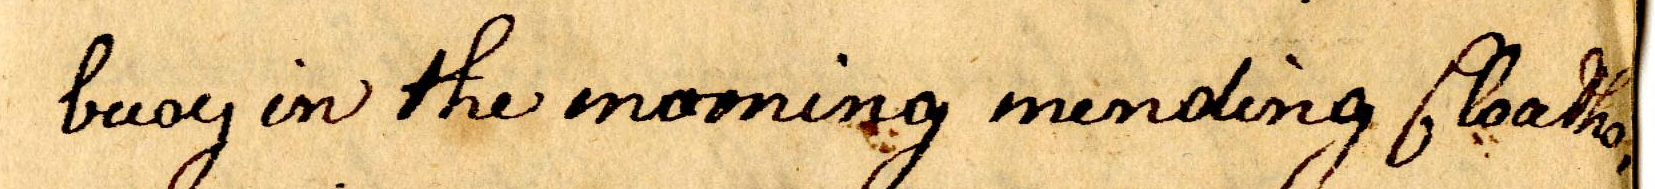busy in the morning mending Cloaths
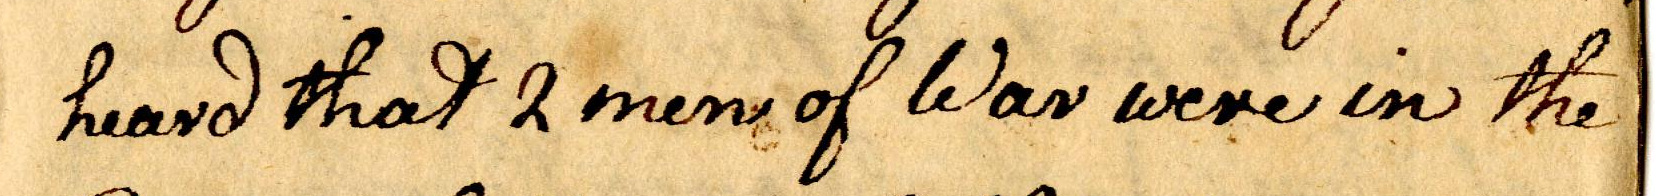heard that 2 men of War were in the
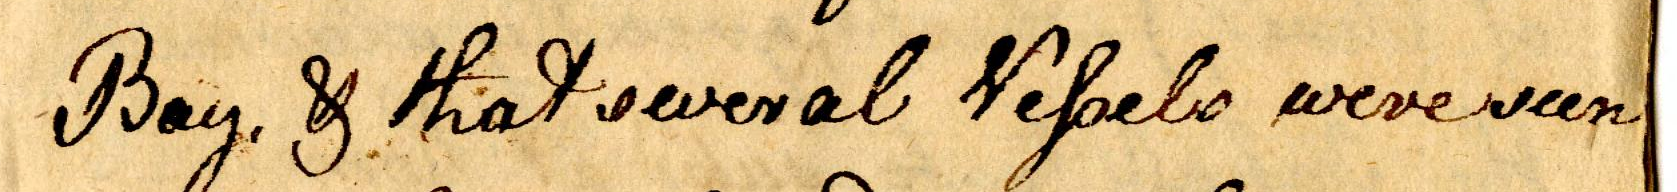Bay, & that several Vessels were seen
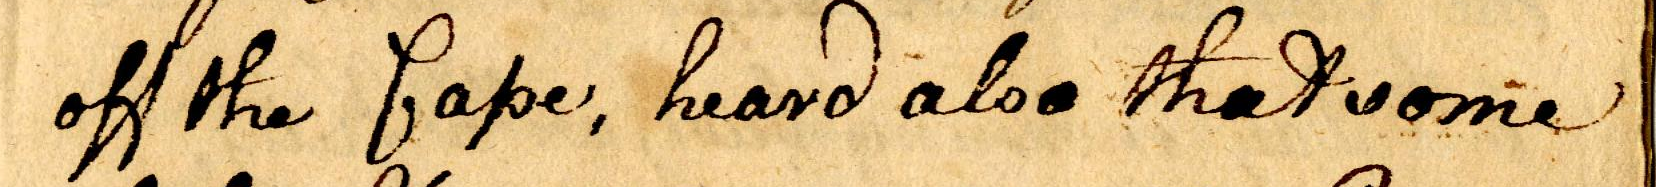off the Cape, heard also that some
